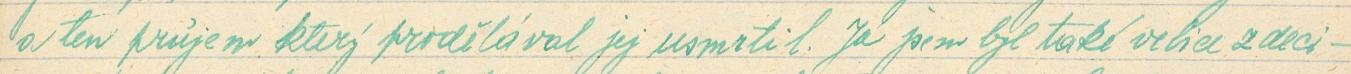a ten průjem který prodělával jej usmrtil. Já jsem byl také velice zdeci-
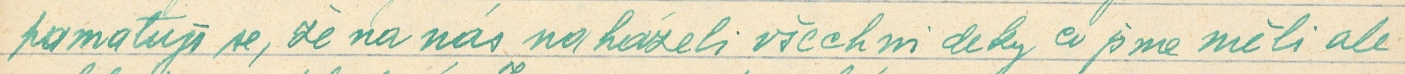pamatuji se, že na nás naházeli všechni deky co jsme měli ale
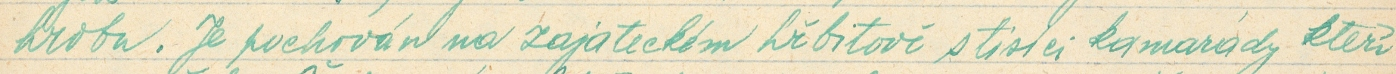hrobu. Je pochován na zajateckém hřbitově s tisíci kamarády kteří
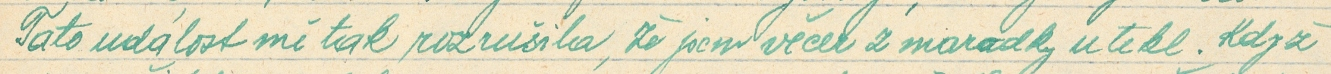Tato událost mě tak rozrušila, že jsem večer z marodky utekl. Když
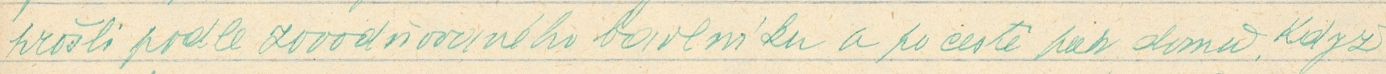prošli podle zavodňovaného bavlníku a po cestě pak domů, Když
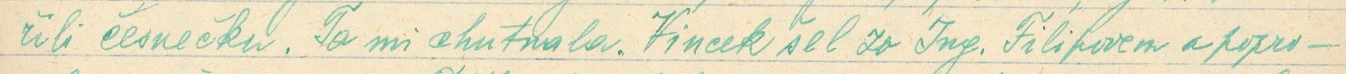řili česnečku. Ta mi chutnala. Vincek šel za Ing. Filipovem a popro-
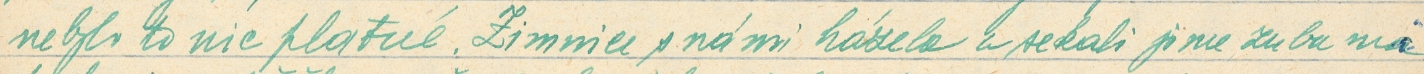nebylo to nic platné. Zimnice s námi házela a sekali jsme zubama
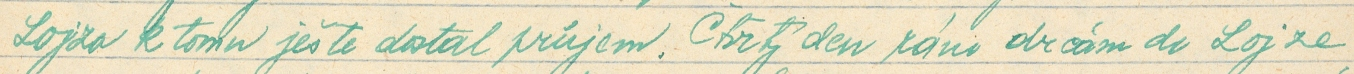Lojza k tomu ješte dostal průjem. Čtvrtý den ráno drcám do Lojze
